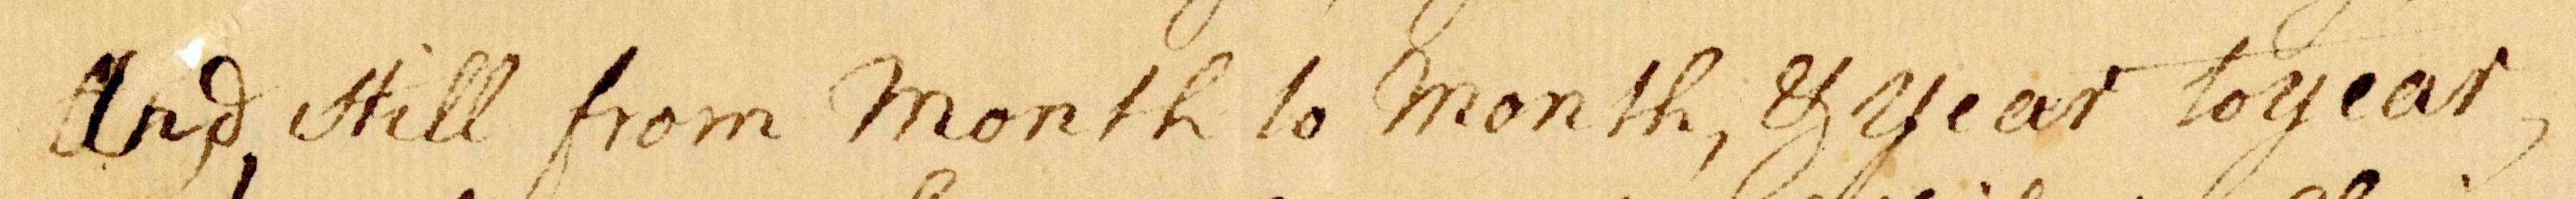And, still from Month to Month, & year toyear,
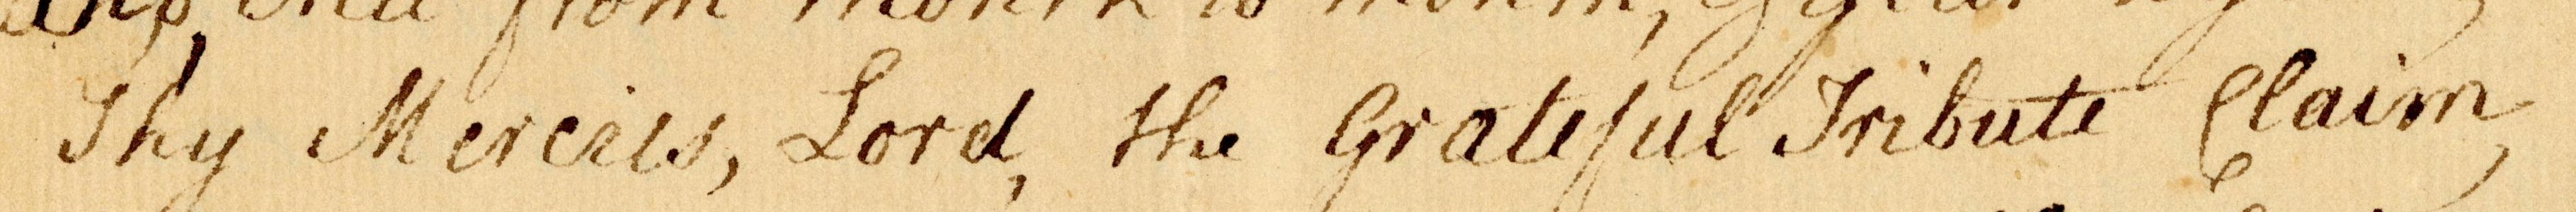Thy Mercies, Lord, the Grateful Tribute Claim,
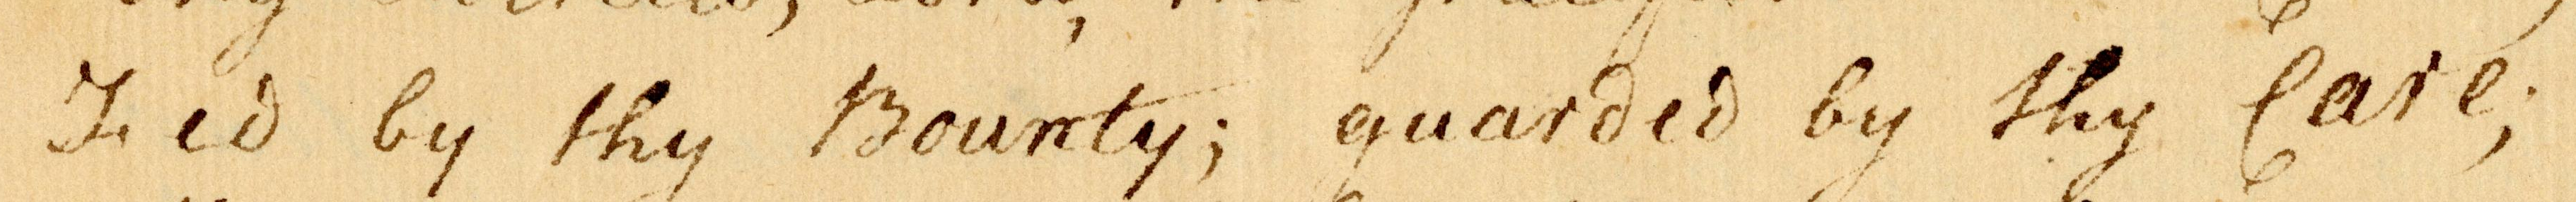Fed by thy Bounty; guarded by thy Care;
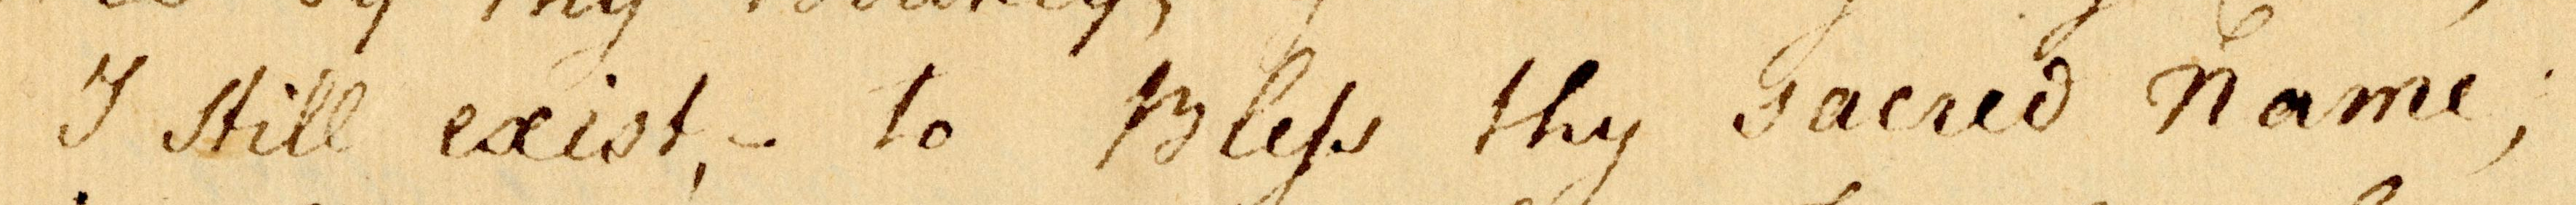I still exist- to Bless thy sacred Name;
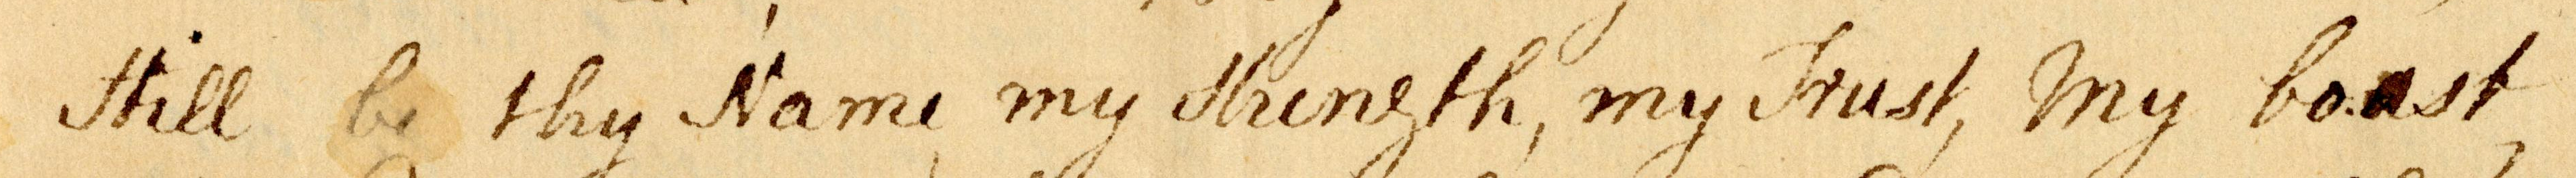still be thy Name, my strength, my Trust, My boast
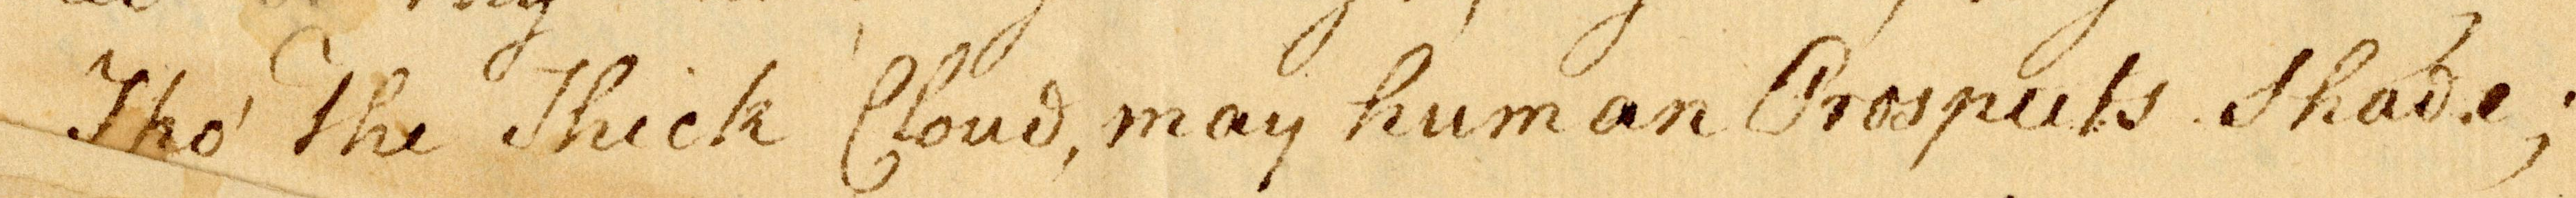Tho' the Thick Cloud, may human Prospects Shade;
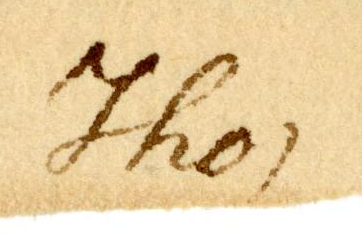Tho,
